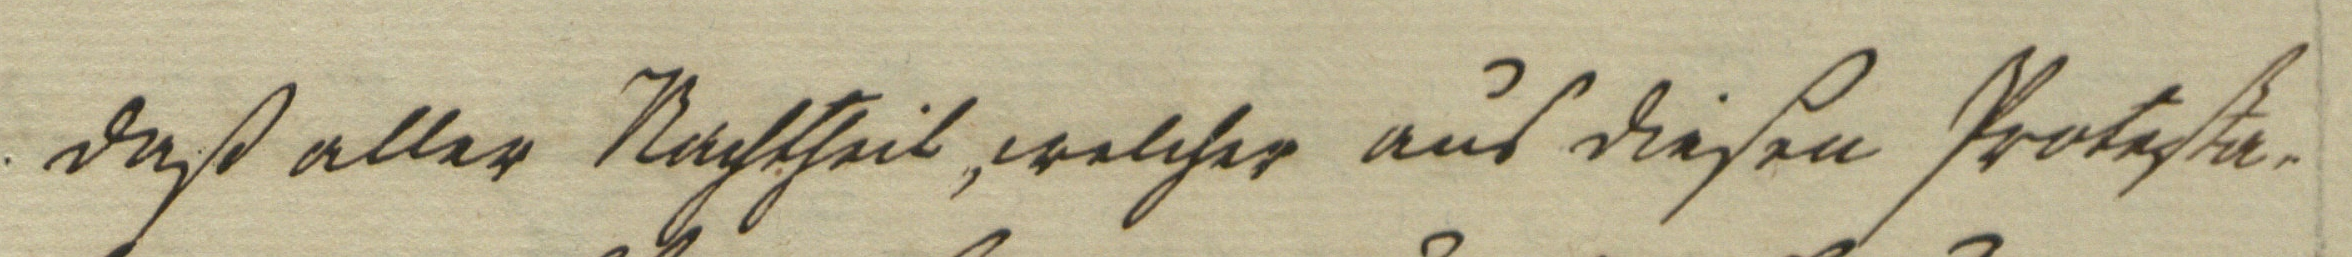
daß aller Nachtheil, welcher aus diesen Protesta¬
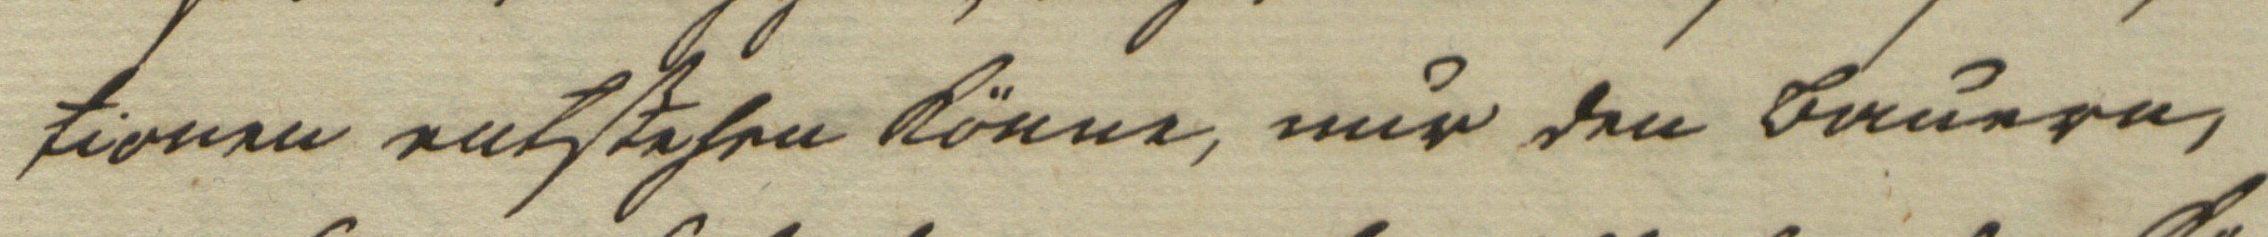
tionen entstehen könne, nur den Bauern,
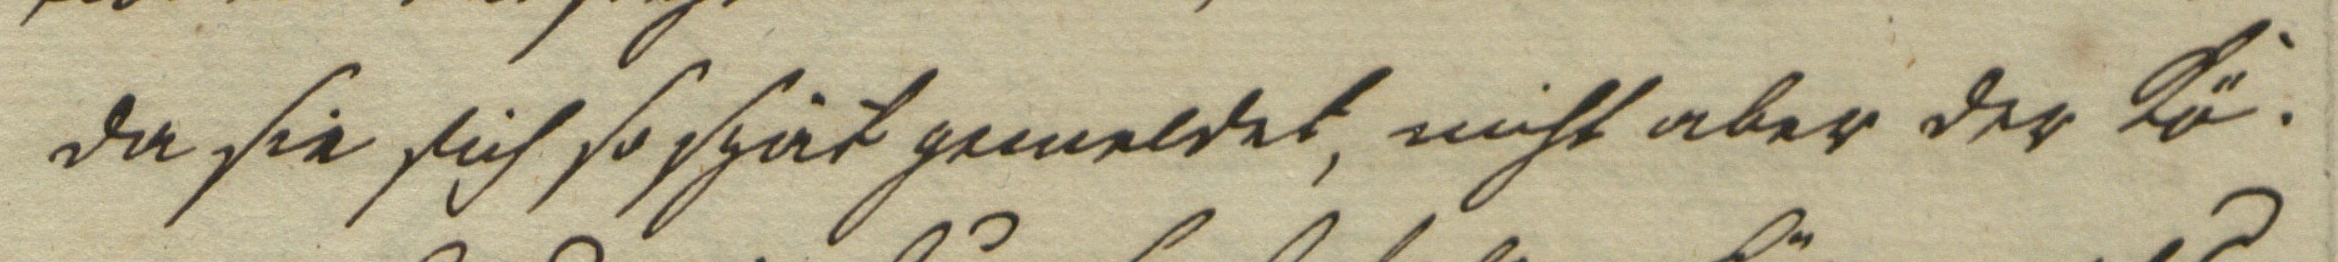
da sie sich so spät gemeldet, nicht aber der Kö¬
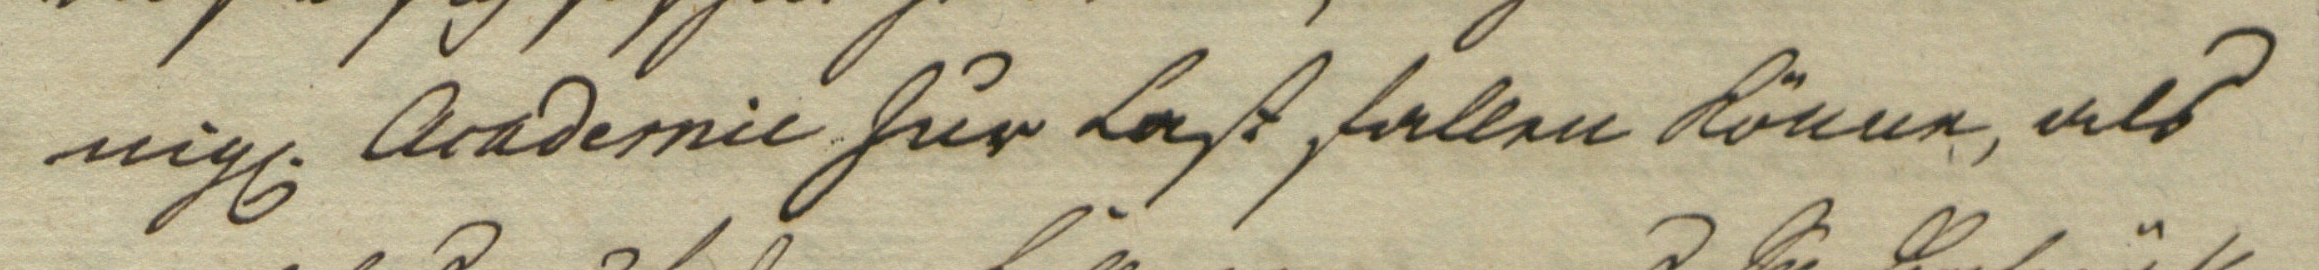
nigl. Academie zur Last fallen könne, als
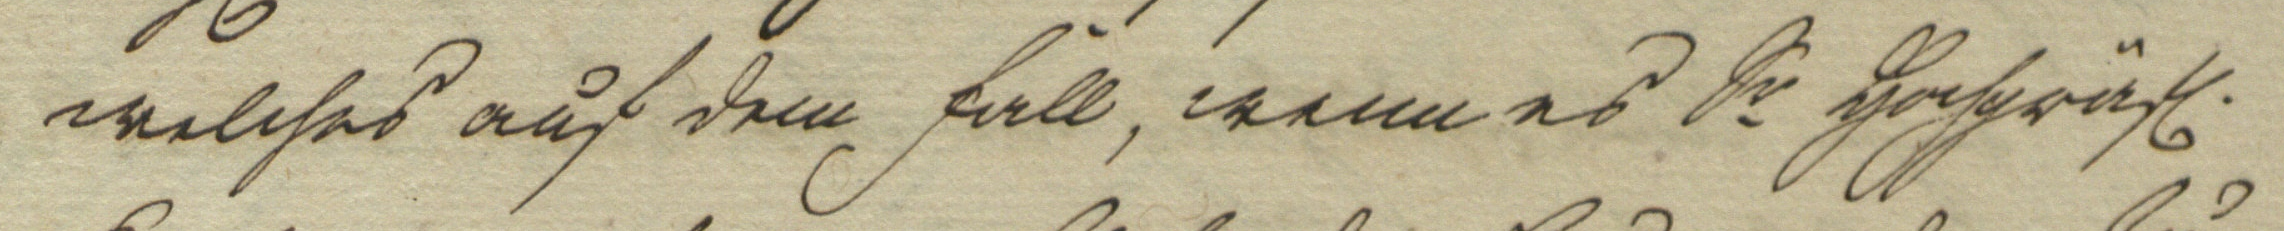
welches auf dem Fall, wenn es Sr Hochgräfl.
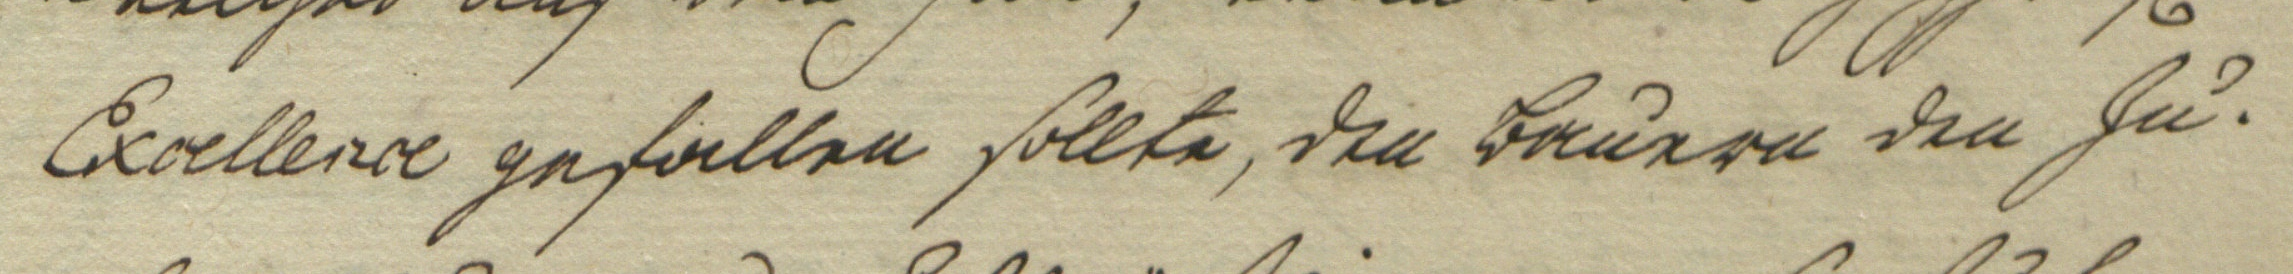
Excellence gefallen sollte, den Bauern den Zu¬
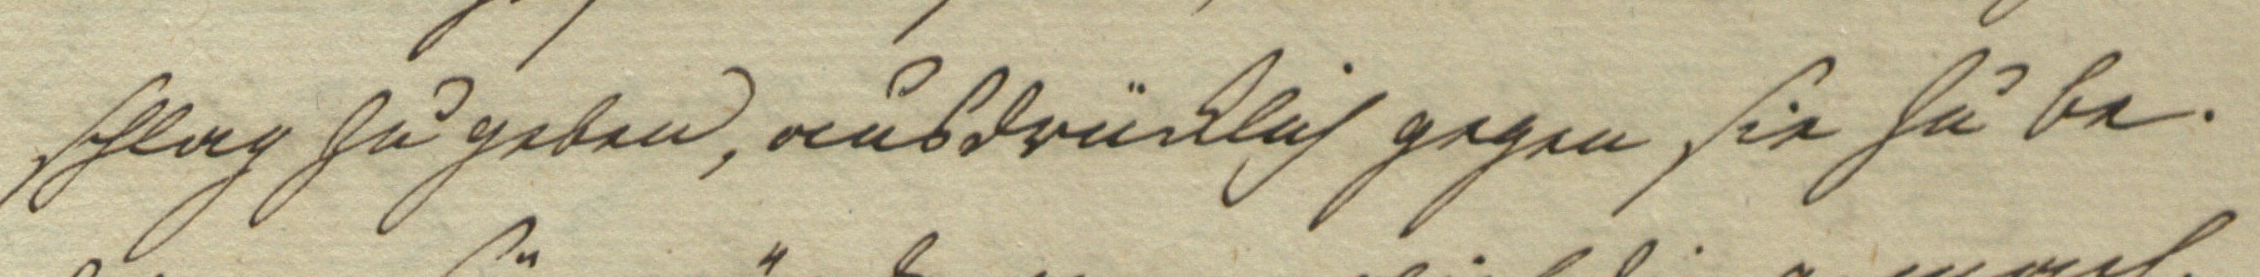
schlag zu geben, ausdrücklich gegen sie zu be¬
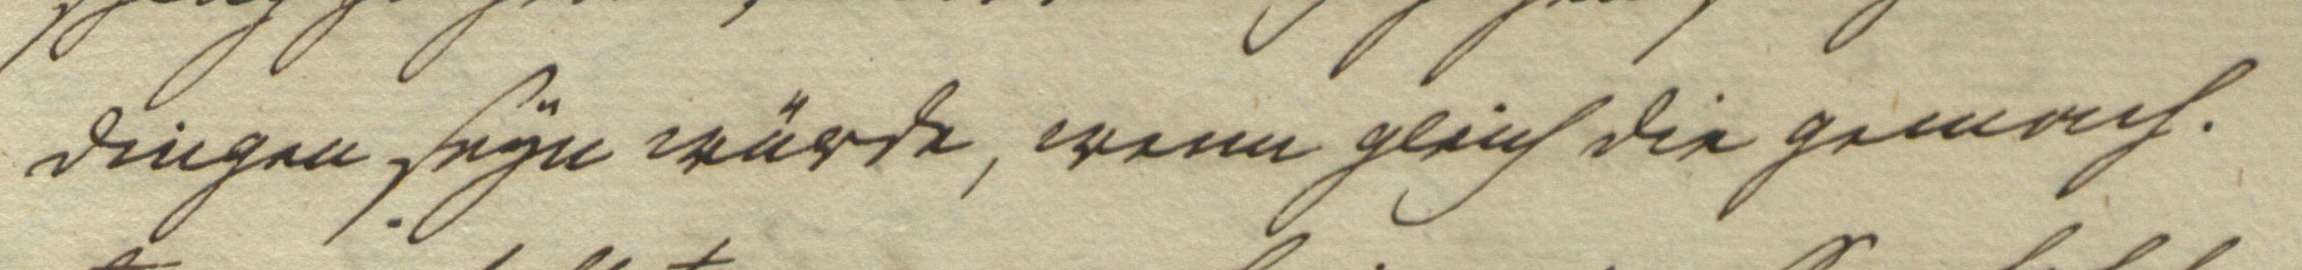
dingen seÿn würde, wenn gleich die gemach¬
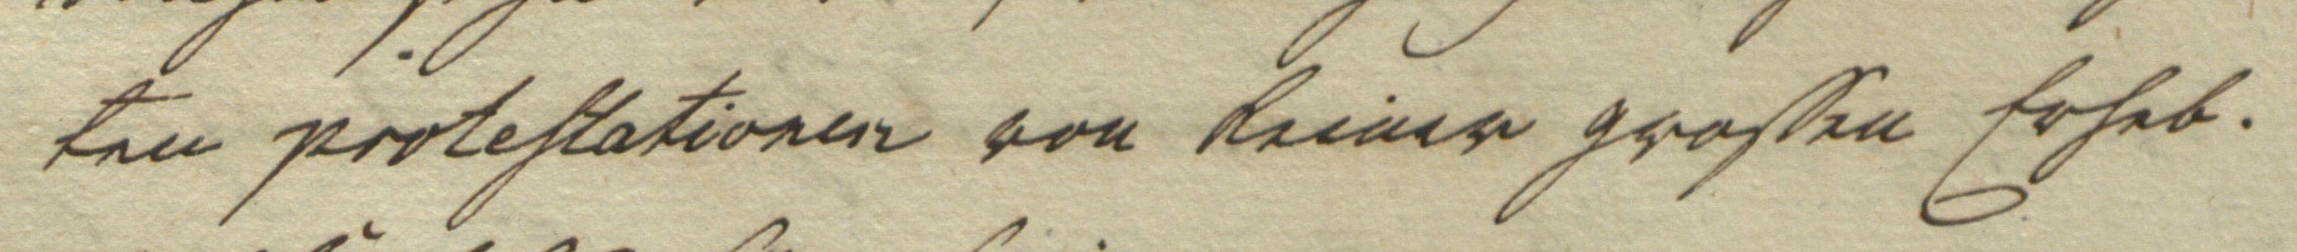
ten protestationen von keiner grossen Erheb¬
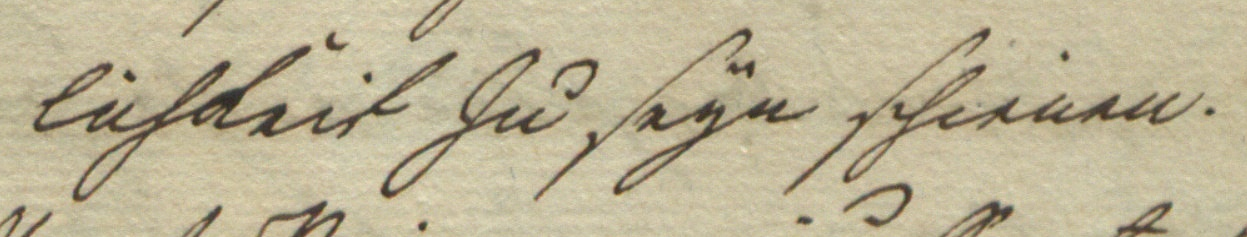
lichkeit zu seÿn schienen.
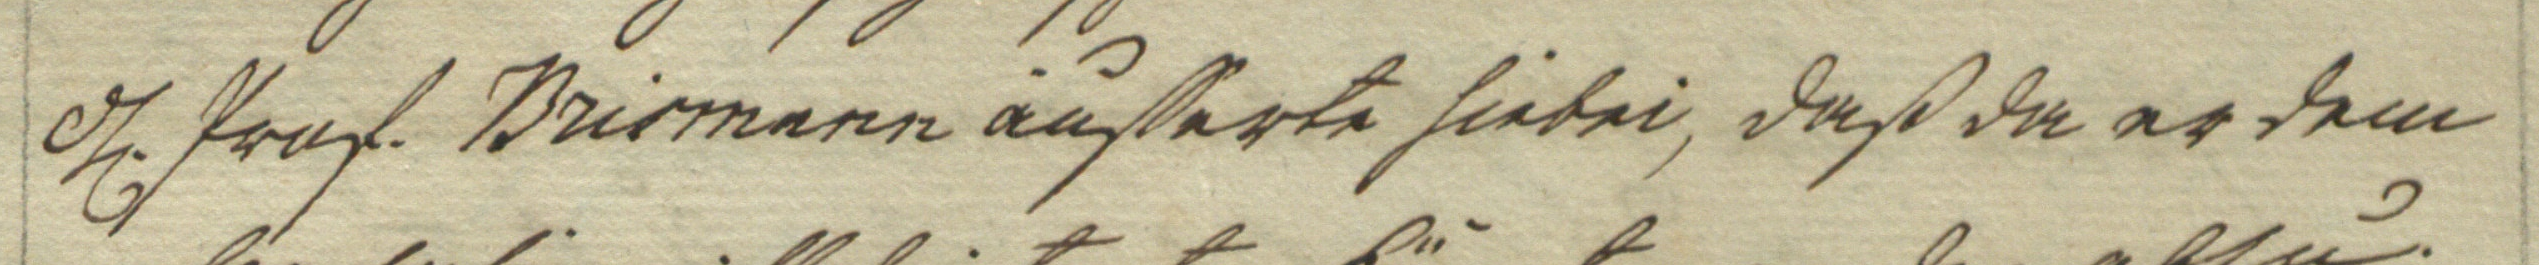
dh. Prof. Brismann äusserte hiebei, daß da er dem
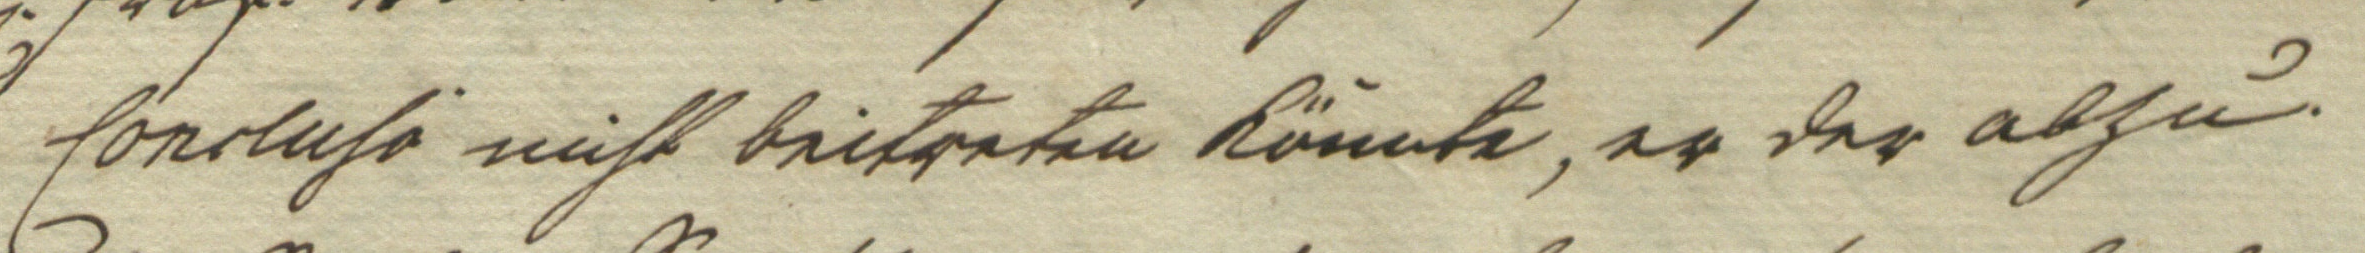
Concluso nicht beitreten könnte, er der abzu¬
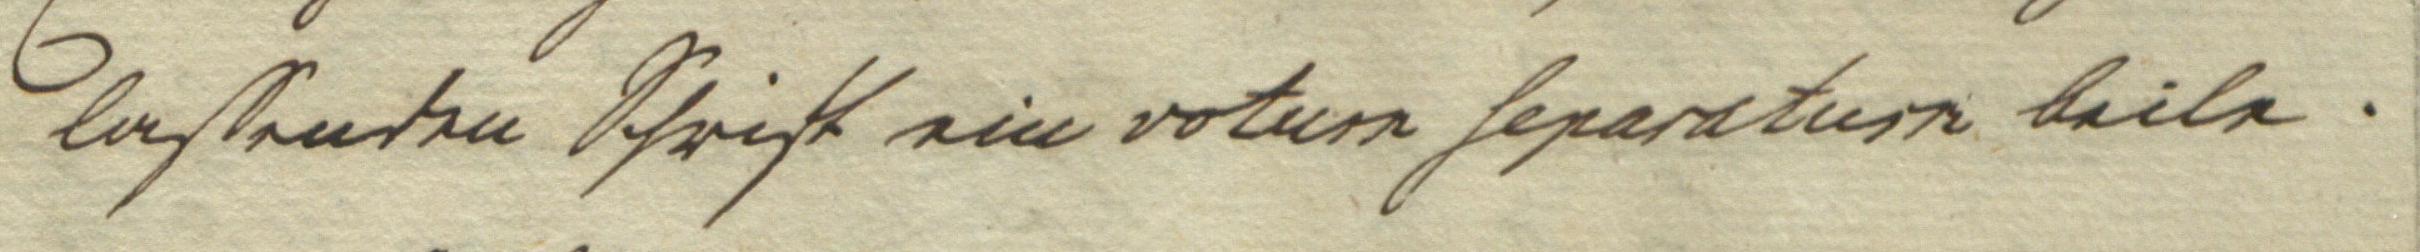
lassenden Schrift ein votum separatum beile-
